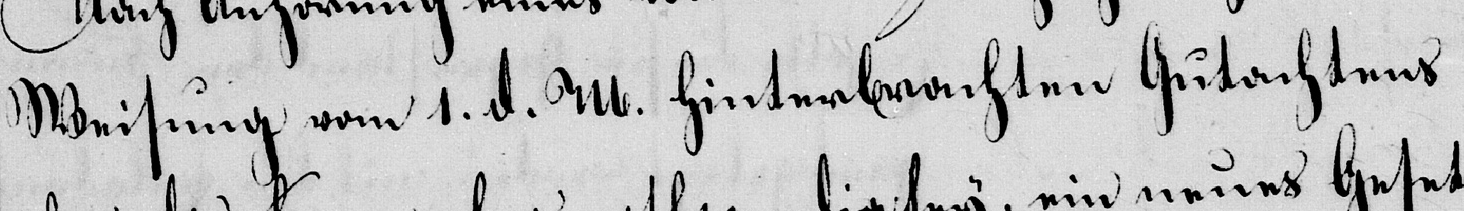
Weisung vom 1. d. M. hinterbrachten Gutachtens
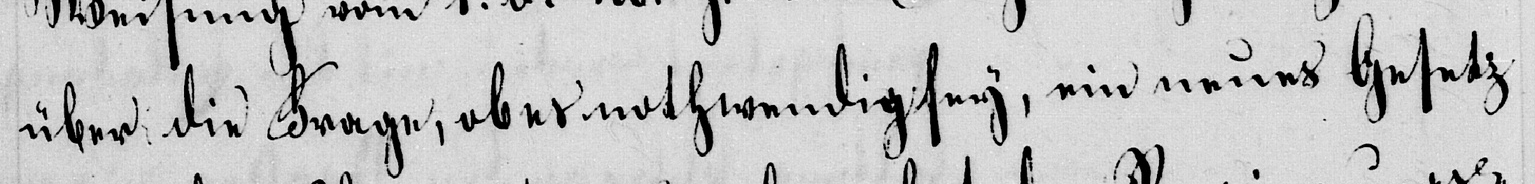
über die Frage, ob es nothwendig sey, ein neues Gesetz
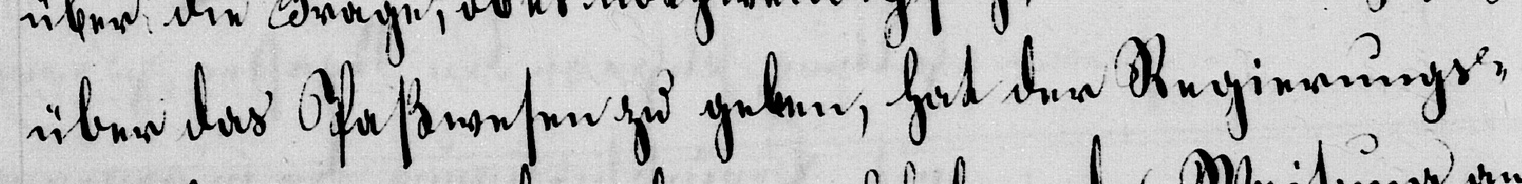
über das Paßwesen zu geben, hat der Regierungs¬
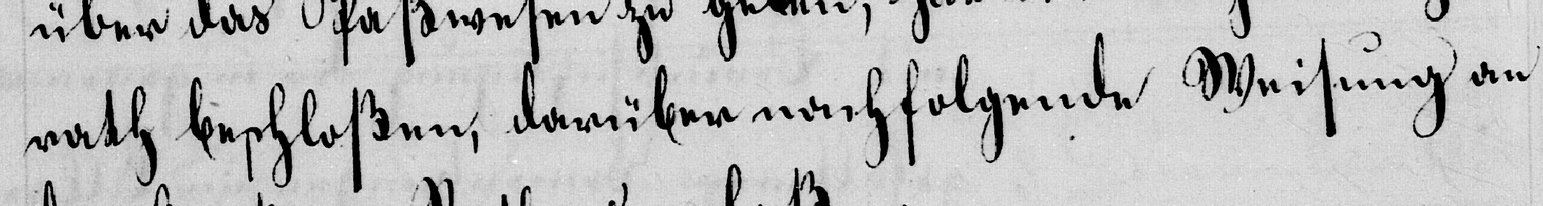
rath beschloßen, darüber nachfolgende Weisung an
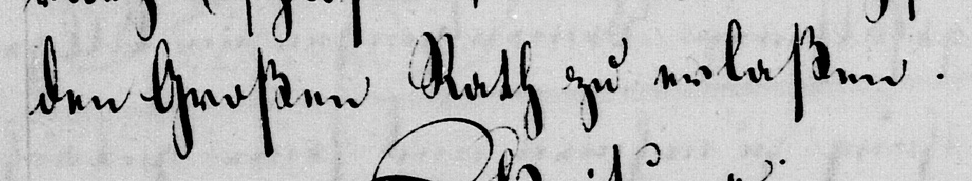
den Großen Rath zu erlaßen.
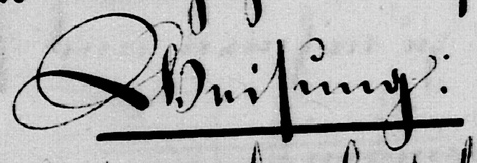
Weisung:
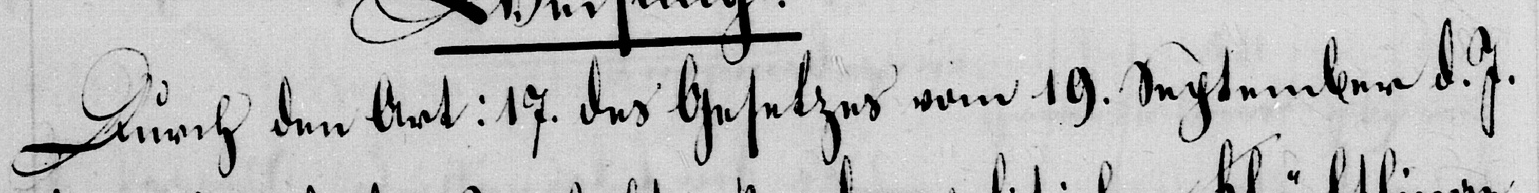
Durch den Art: 17. des Gesetzes vom 19. September d. J.
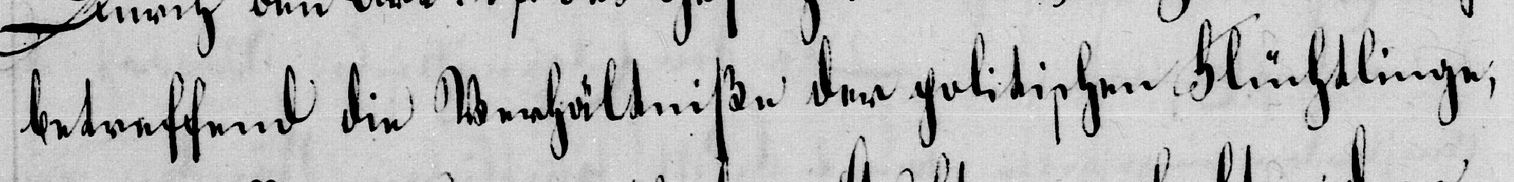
betreffend die Verhältniße der politischen Flüchtlinge,
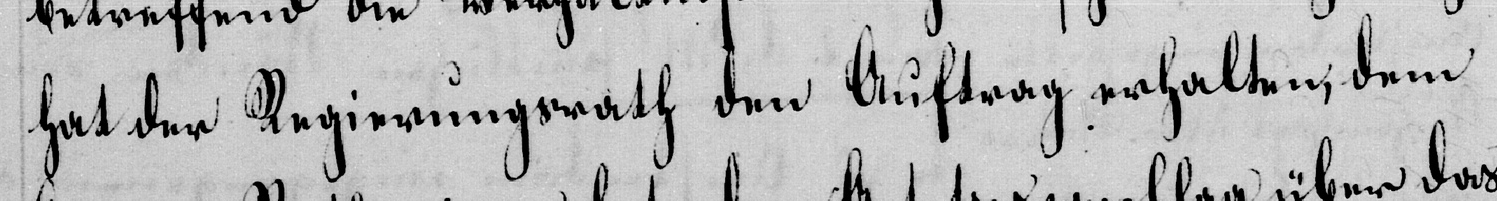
hat der Regierungsrath den Auftrag erhalten, dem
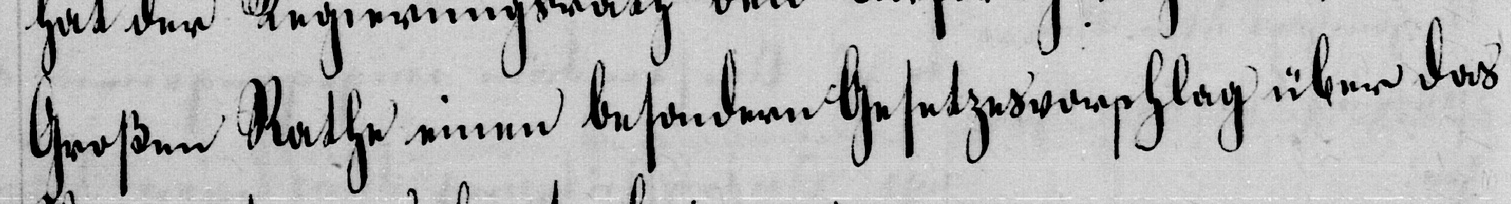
Großen Rathe einen besondern Gesetzesvorschlag über das
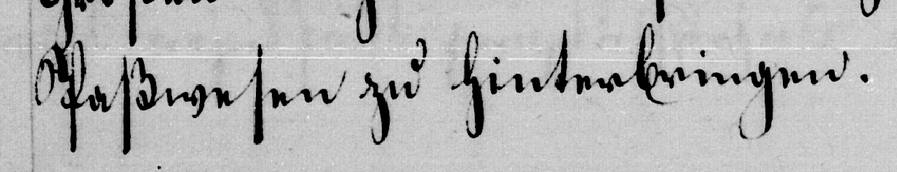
Paßwesen zu hinterbringen.
